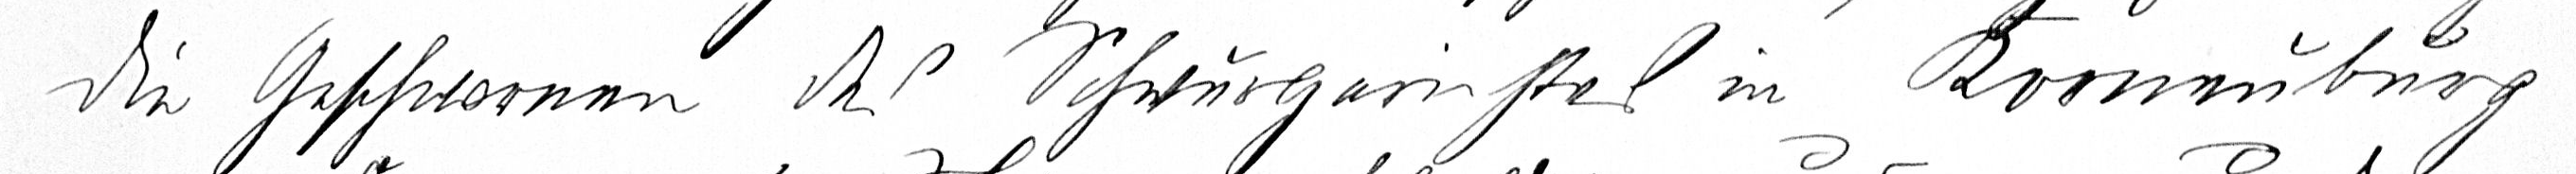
die Geschwornen des Schwurgerichtes in Korneuburg
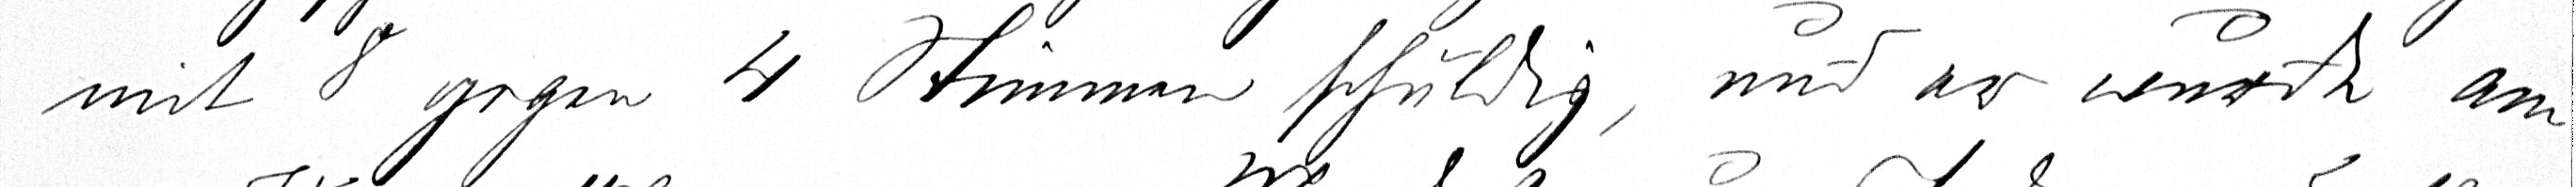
mit 8 gegen 4 Stimmen schuldig, und er wurde am
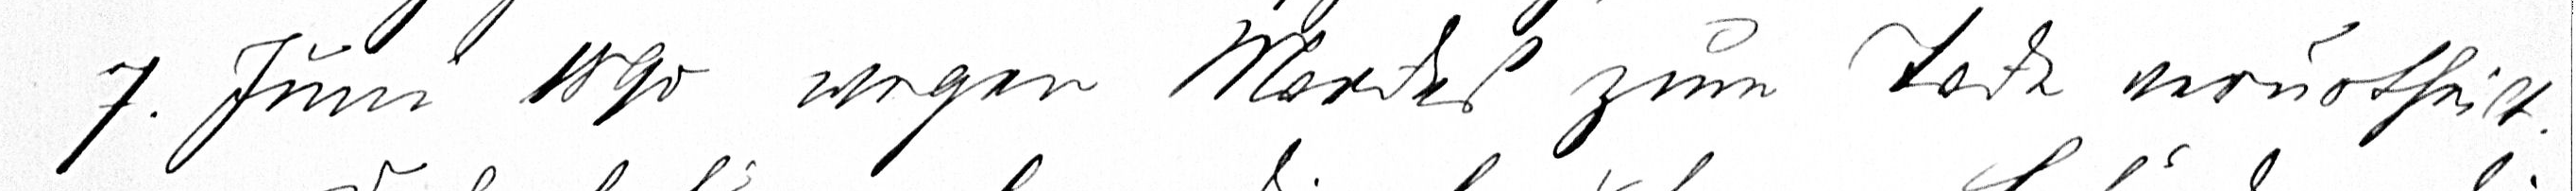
7. Juni 1890 wegen Mordes zum Tode verurtheilt.
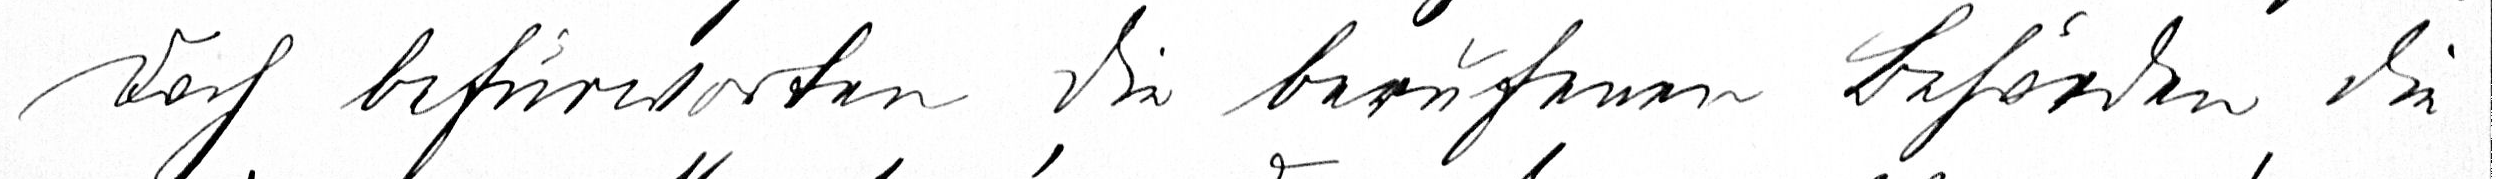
Doch befürworten die berufenen Behörden die
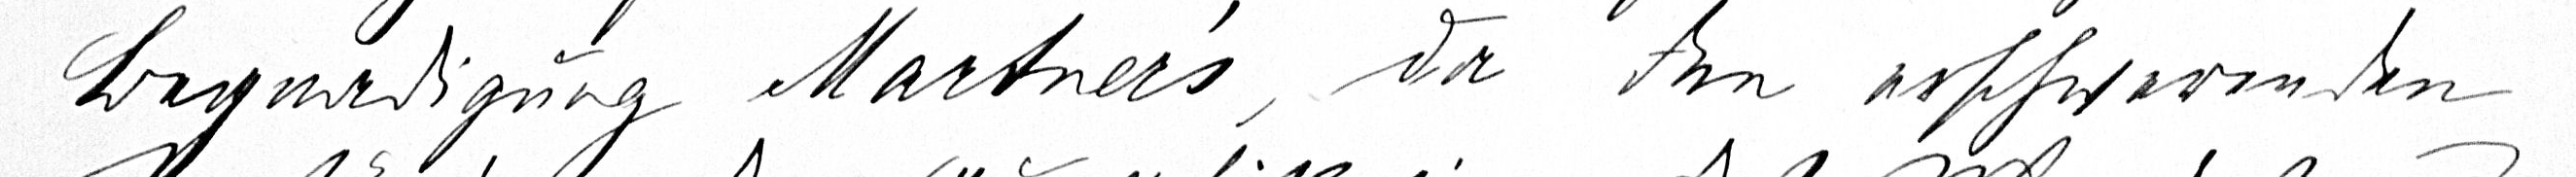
Begnadigung Martner's, da den erschwerenden
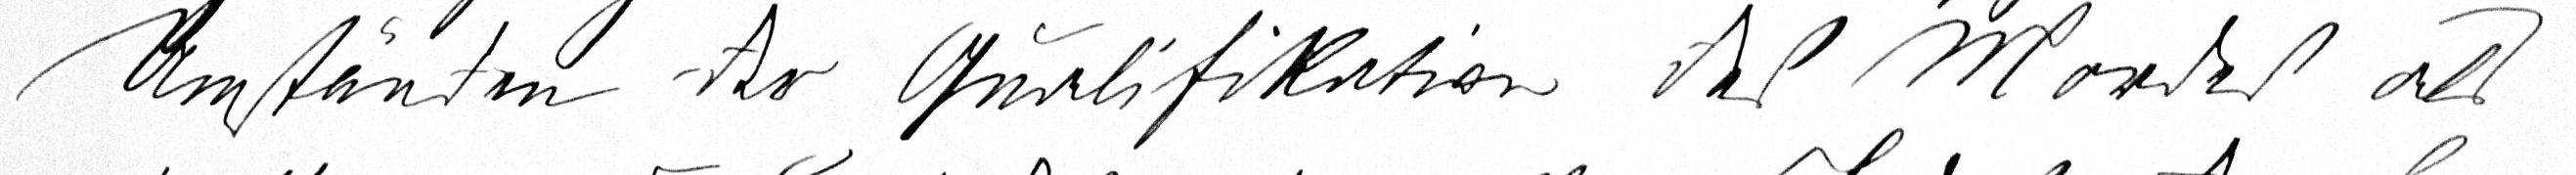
Umständen der Qualifikation des Mordes als
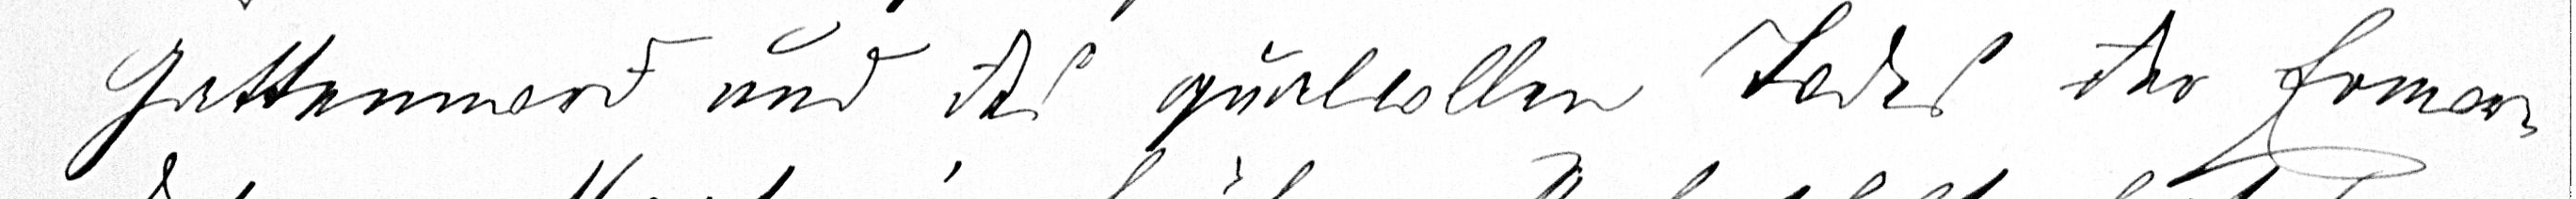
Gattenmord und des qualvollen Todes der Ermor¬
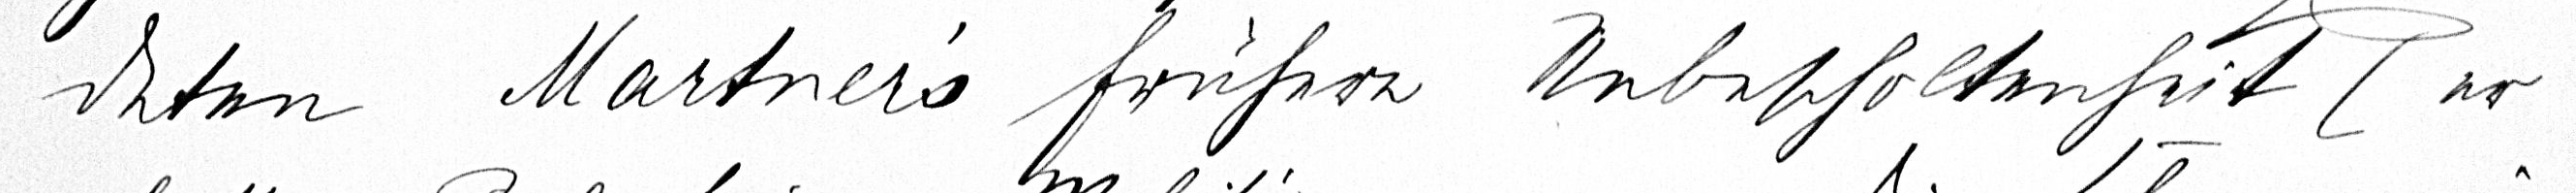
deten Martner's frühere Unbescholtenheit (er
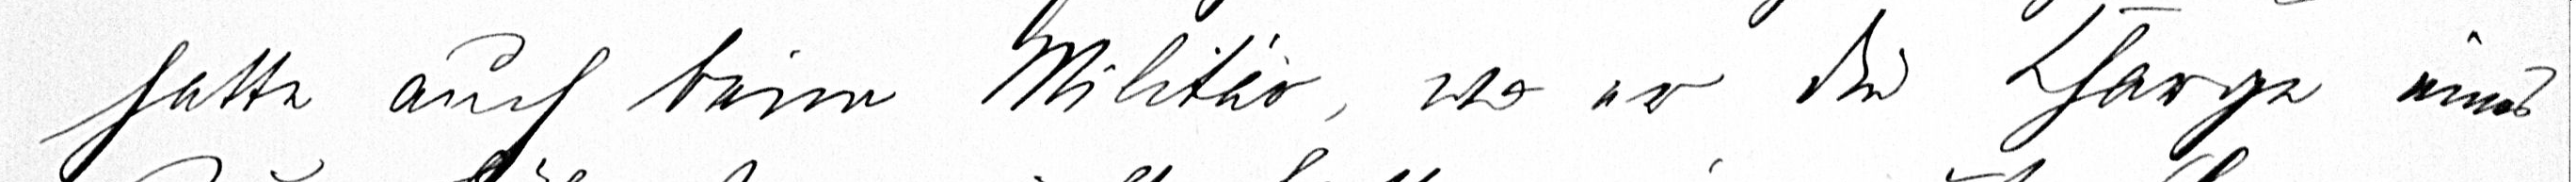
hatte auch beim Militär, wo er die Charge eines
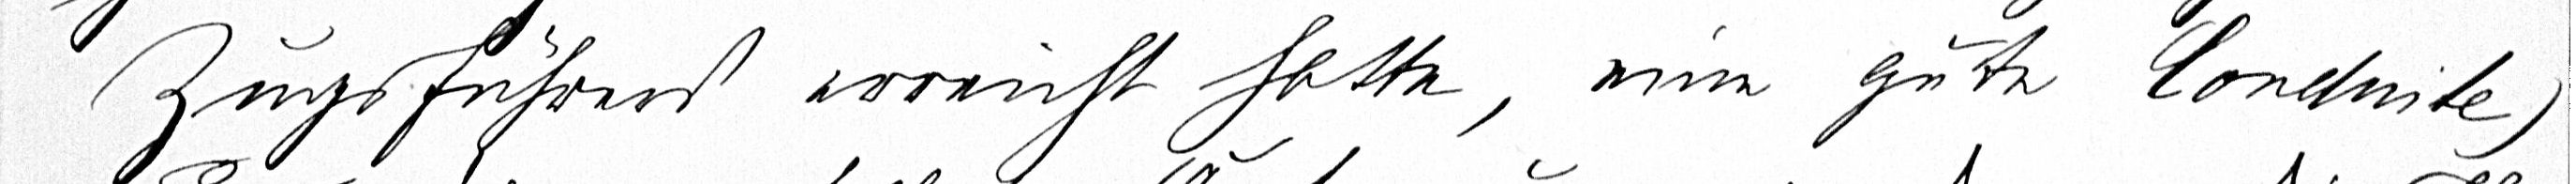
Zugsführers erreicht hatte, eine gute xxnite)
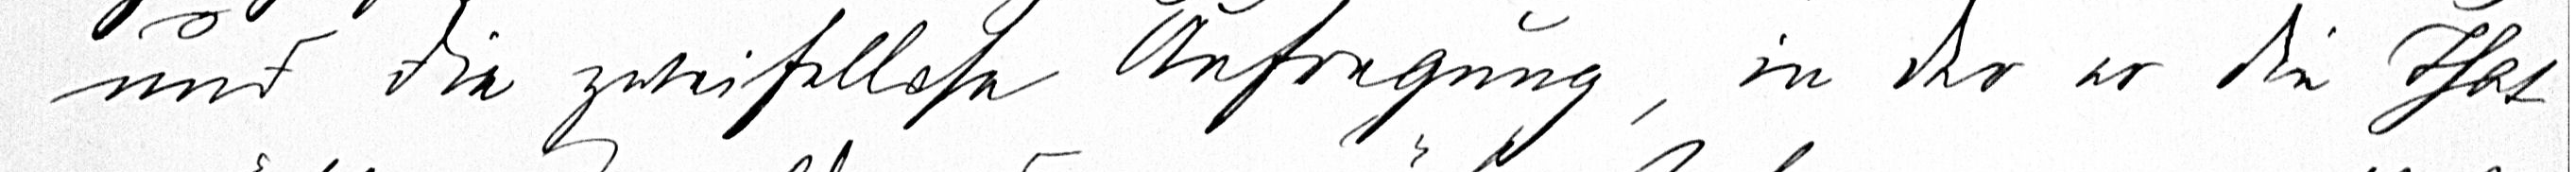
und die zweifellose Aufregung, in der er die That
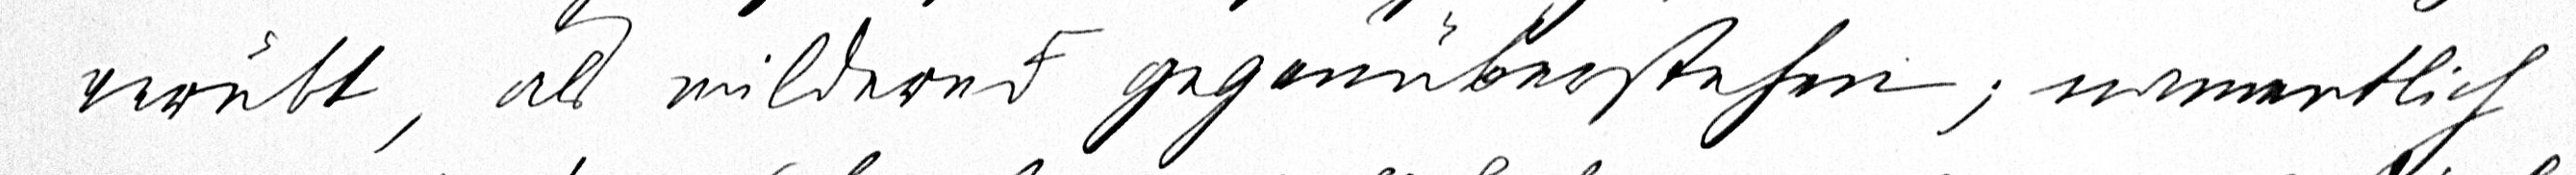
verübt, als mildernd gegenüberstehen; namentlich
